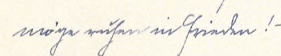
möge ruhen in Frieden! -
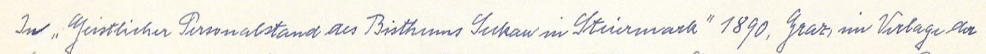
In "Geistlicher Personalstand des Bisthums Seckau in Steiermark" 1890, Graz, im Verlage der
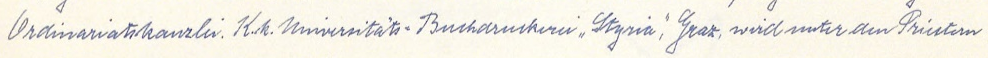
Ordinariatskanzlei. K. k. Universitäts-Buchdruckerei "Styria", Graz, wird unter den Priestern
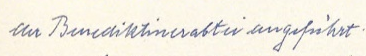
der Benediktinerabtei angeführt:
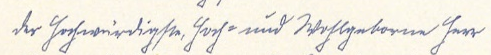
Der hochwürdigste, hoch- und wohlgeborene Herr
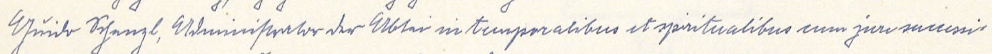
Guido Schenzl, Administrator der Abtei in temporalibus et spirtualibus cum jure succesi-
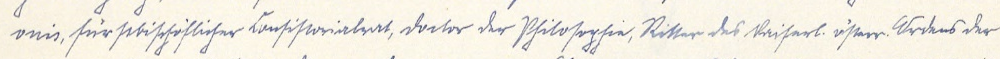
onis, für scbischriftlicher xxx, Doctor der Philosophie, Ritter des kaiserl. österr. Ordens der
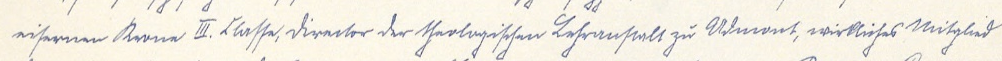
eisernen Krone III. Classe, Director der theologischen Lehranstalt zu Admont, wichtiges Mitglied
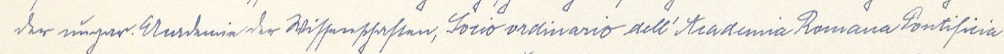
der ungar. Academie der Wissenschaften, Socio ordinario dell'Academia Romana Pontificia
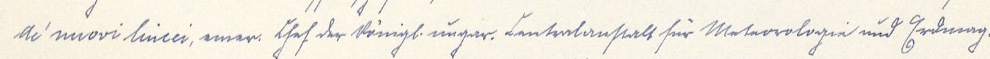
de'nuovi lincei, xxx Chef der königl. ungar. Centralanstalt für Meteorologie und Erdmag-
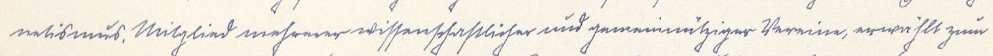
netismus, Mitglied mehrerer wissenschaftlicher und gemeinnütziger Vereine, erwählt zum
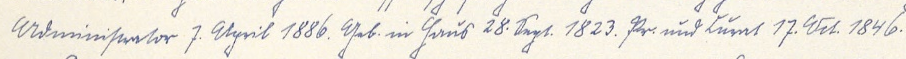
Administrator 7. April 1886. Geb. in Haus 28. Sept. 1823. Pr. und Curat 17. Sept. 1846.
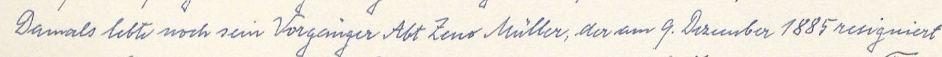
Damals lebte noch sein Vorgänger Abt Zeno Müller, der am 9. Dezember 1885 resigniert
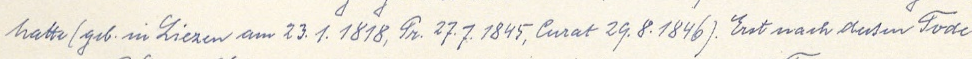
hatte (geb. in Liezen am 23.1.1818, Pr. 27.7.1845, Curat 29.8.1847). Erst nach dessen Tode
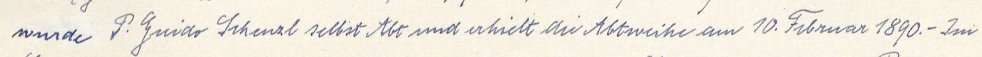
wurde P. Guido Schenzl selbst Abt und erhielt die Abtweihe am 10. Februar 1890. - Im
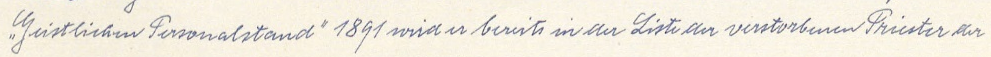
"Geistlichen Personalstand! 1891 wird er bereits in der Liste der verstorbenen Priester der
